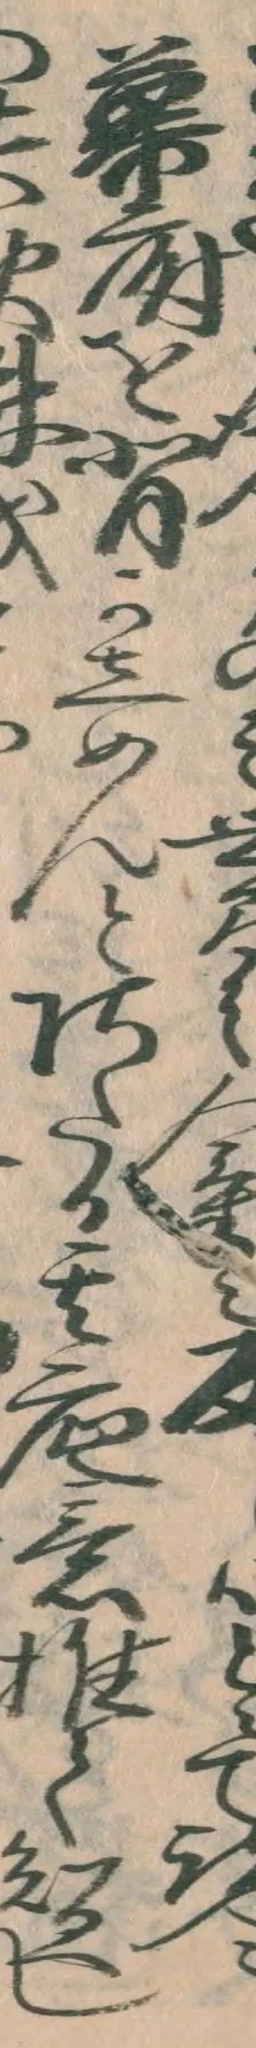幕府を背かしめんと巧たる其底意推て知るへし
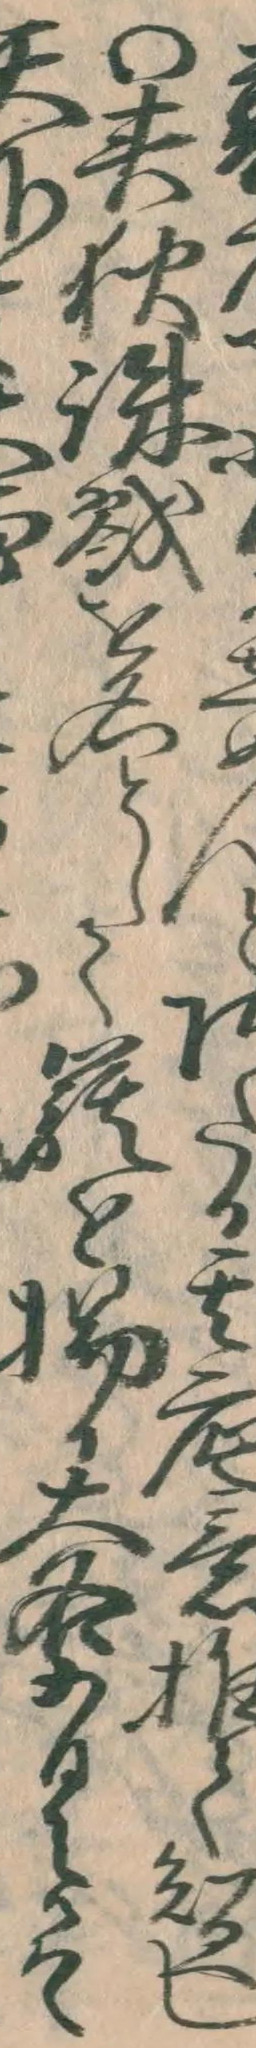○夷狄誅戮を名として簱を揚候大名有之候ハヽ
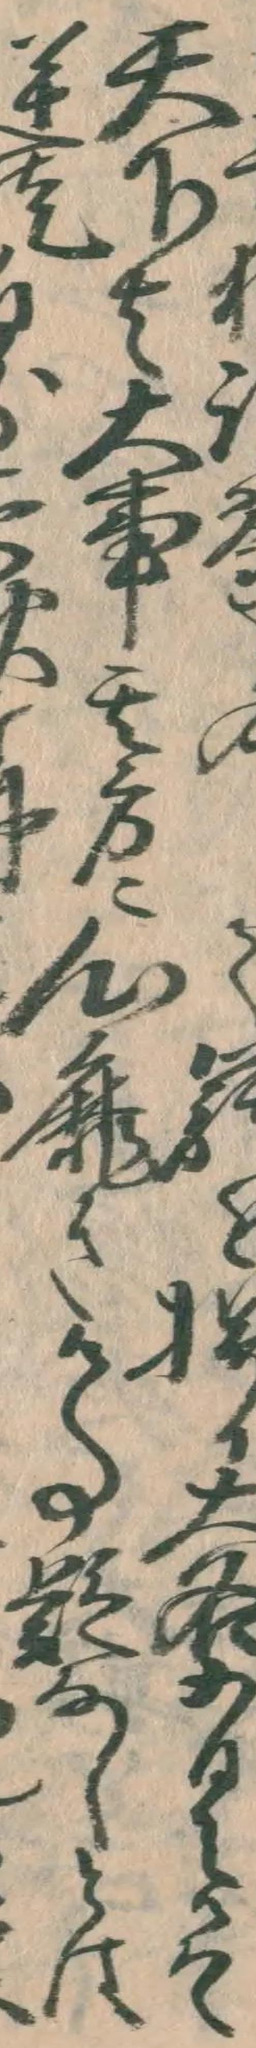天下者大事其方ニ心靡き候事疑なしとは
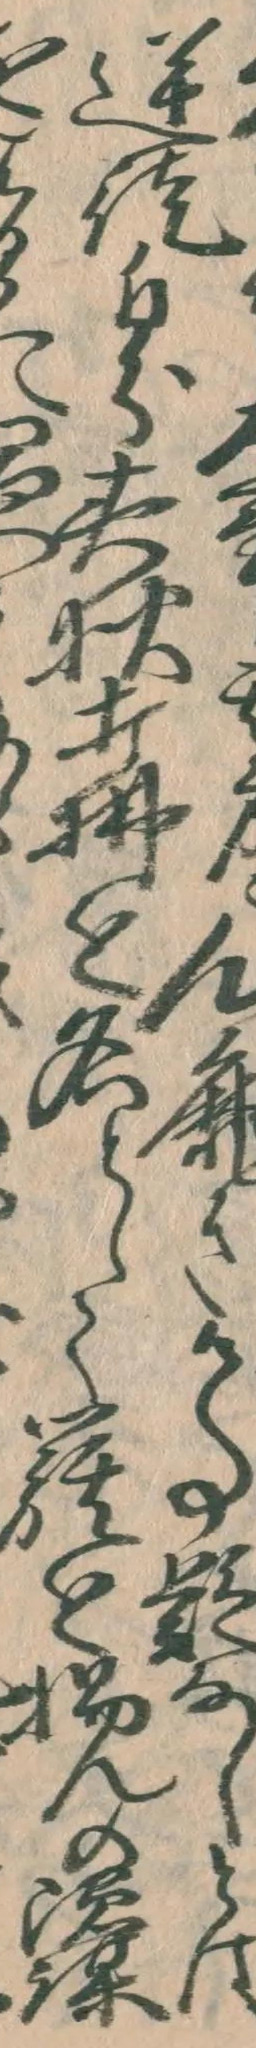逆徒自分夷狄打拂を名として簱を揚んの隠謀
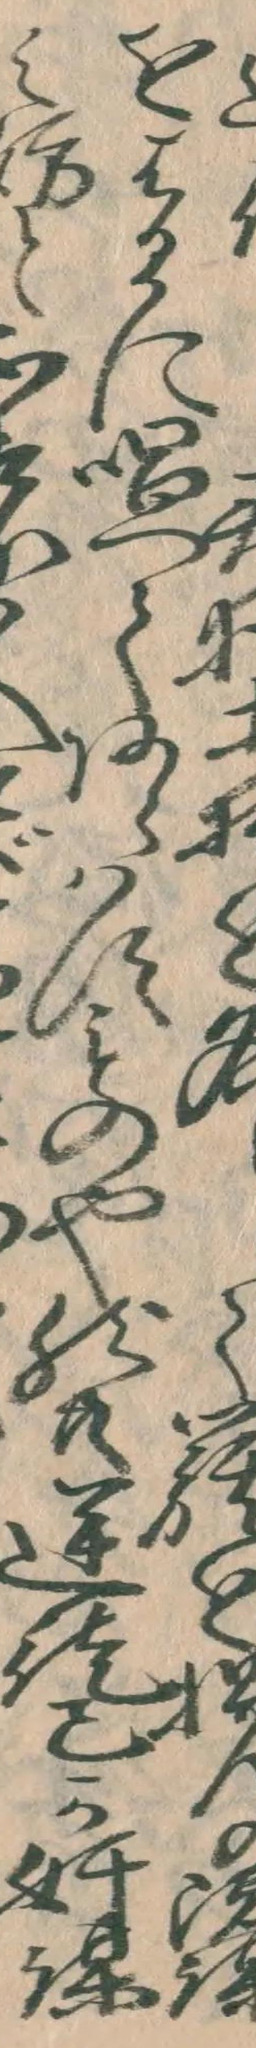をはるかに唱へてあらハすものや然共逆徒己か奸謀
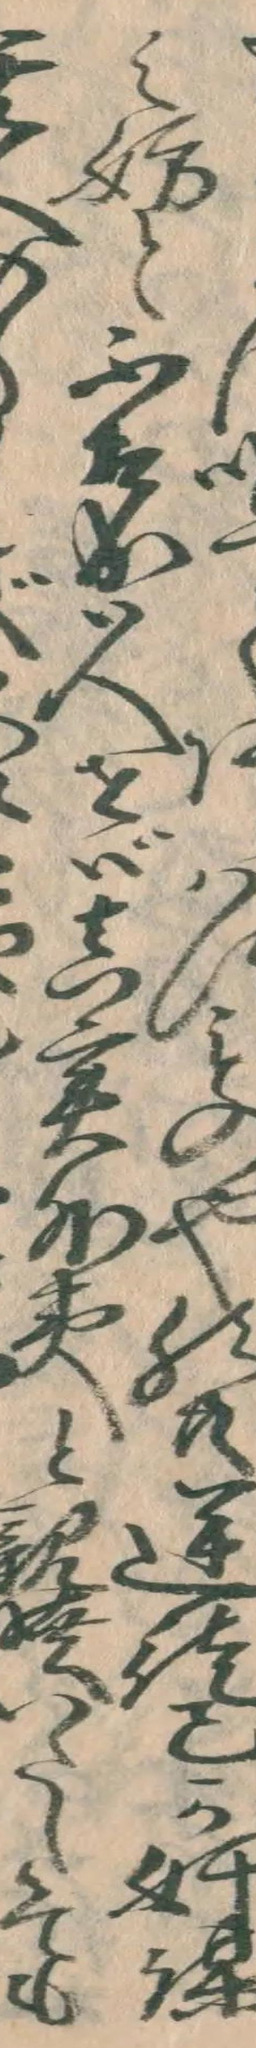之妨に不相成候人をバ真実外夷と親睦いたし候ても
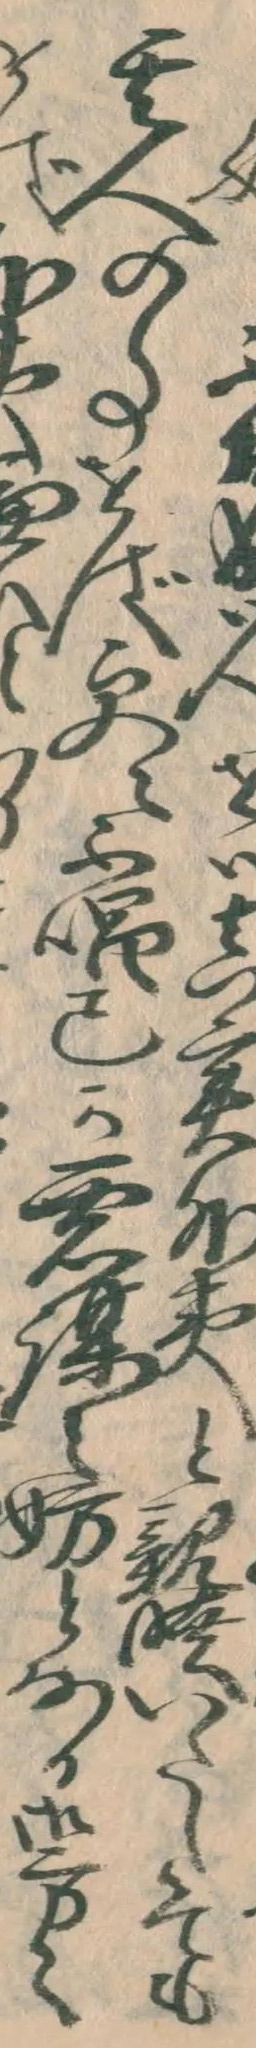其人の事をば更ニ不唱己か悪謀之妨となる御方々
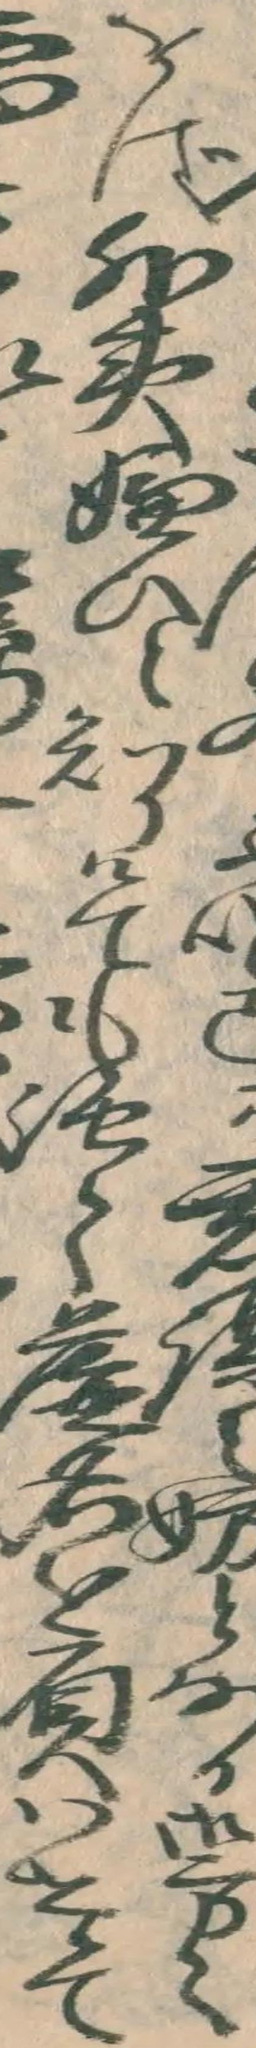をば外夷嫌ひと知り候ても強て虚名を負ハせ候て
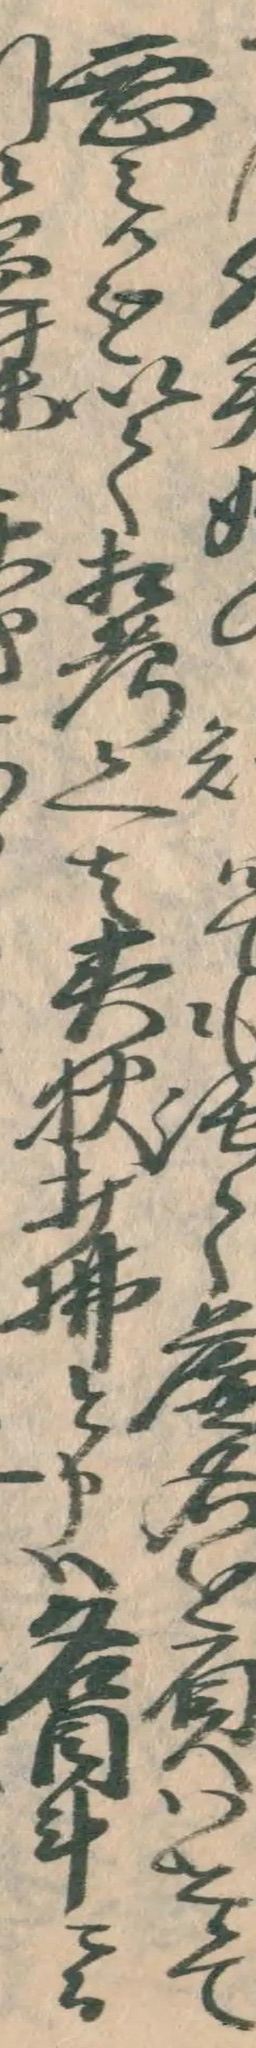悪ミ候を以て相考候へ者夷狄打拂と申ハ名目斗ニ而
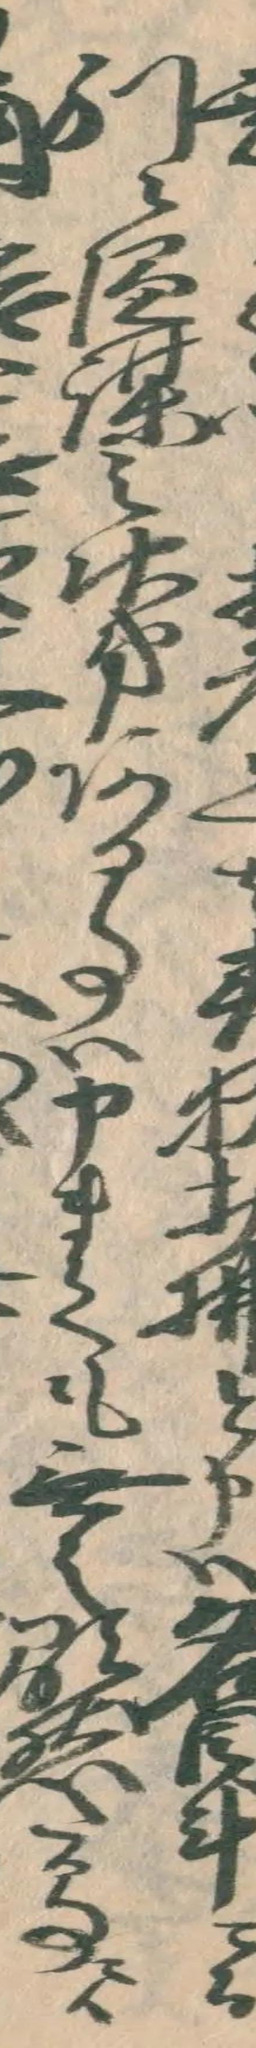別ニ隠謀之次第ある事ハ申まても無之顕然たる事ニ候
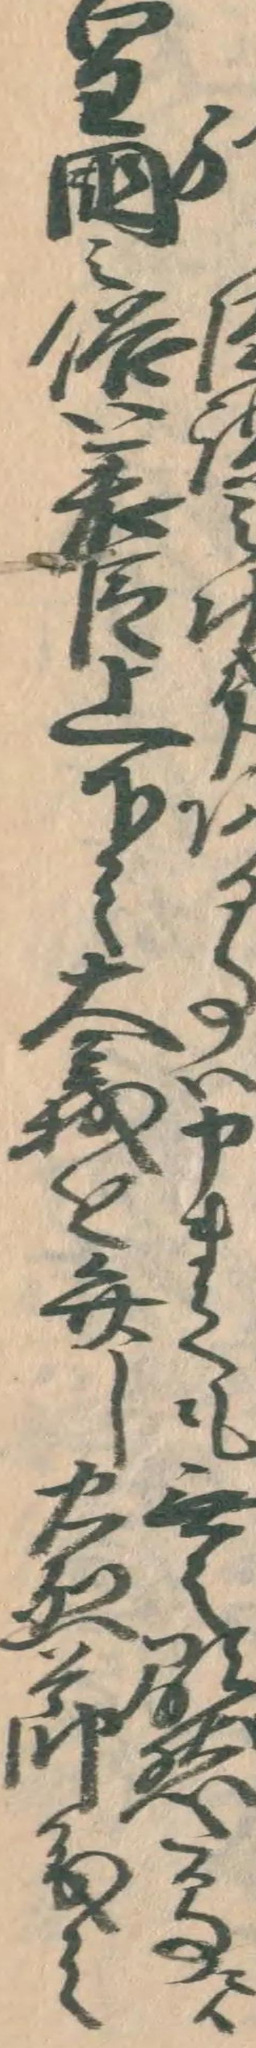皇国之俗ハ君臣上下之大義を弁し忠烈節義之

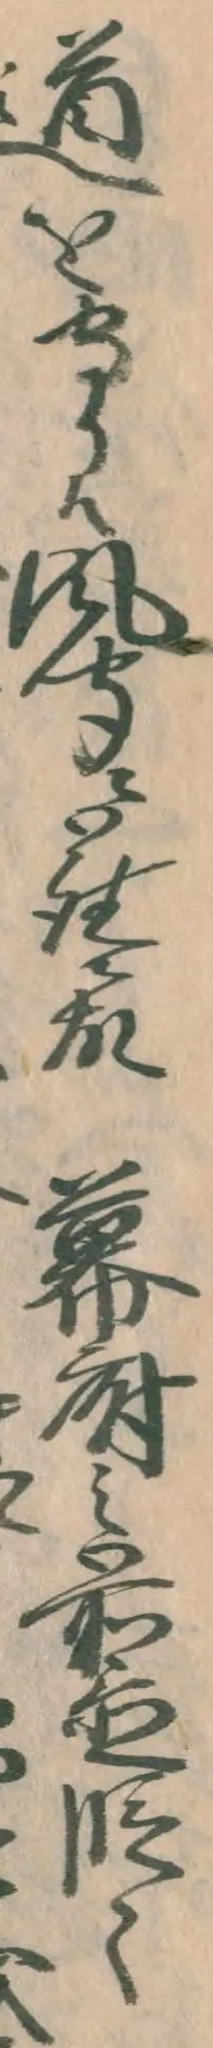道を守り候風聞ニ御座候故幕府之御所置段々
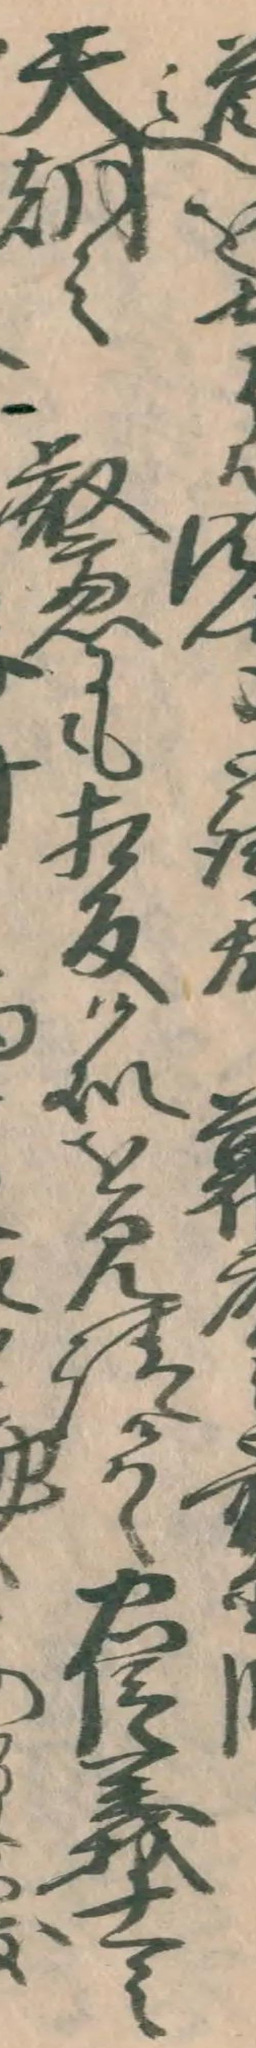天朝之叡慮にも相反候処を見請候ハヽ忠臣義士之
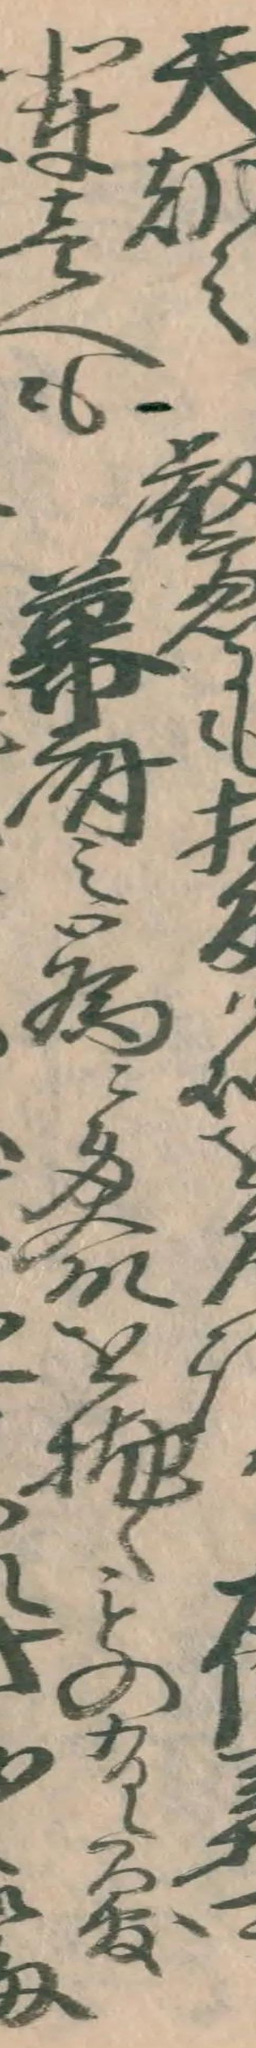輩壱人も幕府之御為ニ身命を抛候もの有之間敷
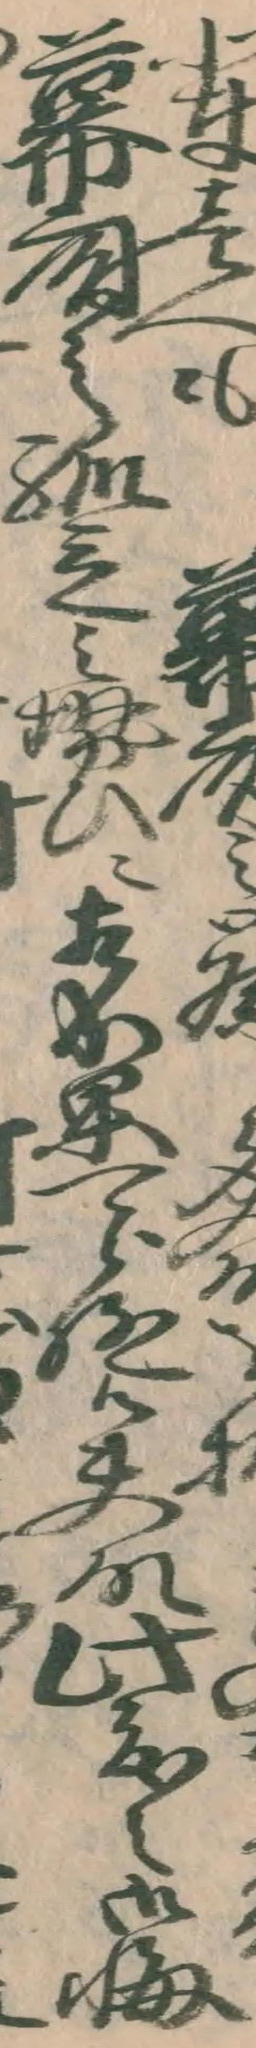幕府之孤立之勢ひニ相成果可被遊候夫故此度之御悔
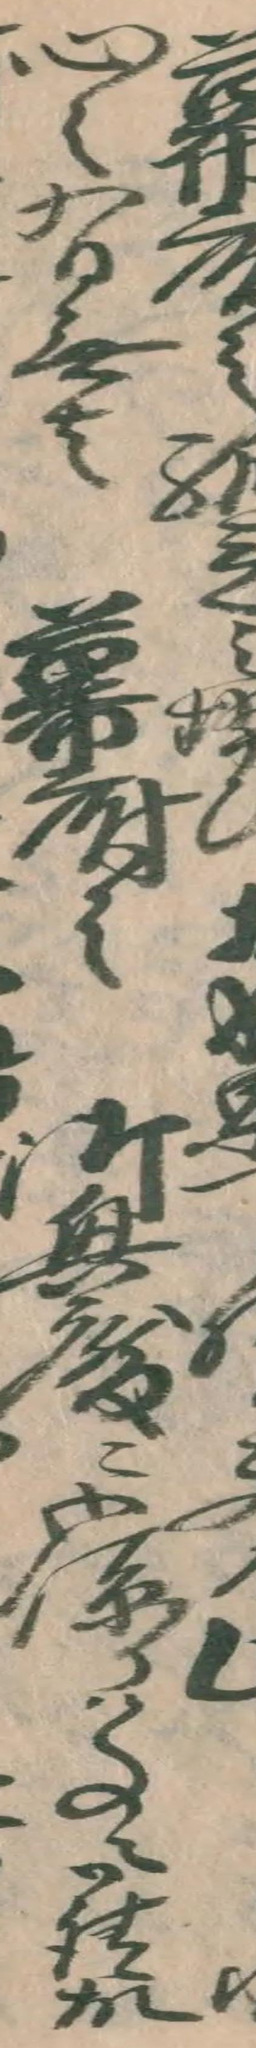心之有無者幕府之御興廃ニ御係り候事ニ御座候故
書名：麗斎叢書. 20
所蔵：国立国会図書館 National Diet Library, JAPAN
